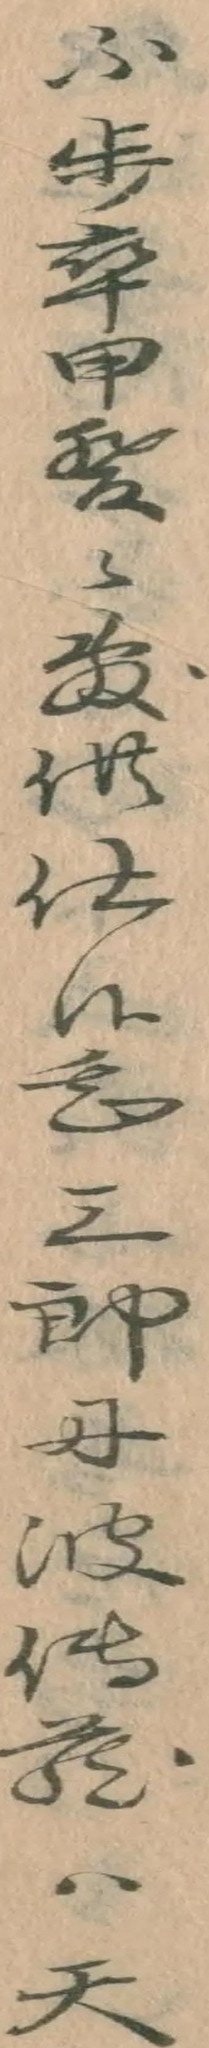ふ歩卒甲斐々敷供仕候甚三郎丹波伝蔵は天
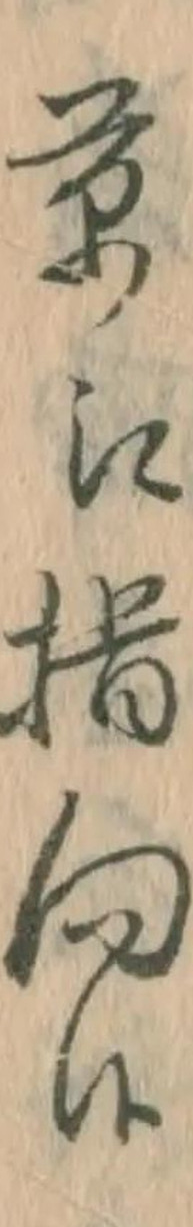草江指向候
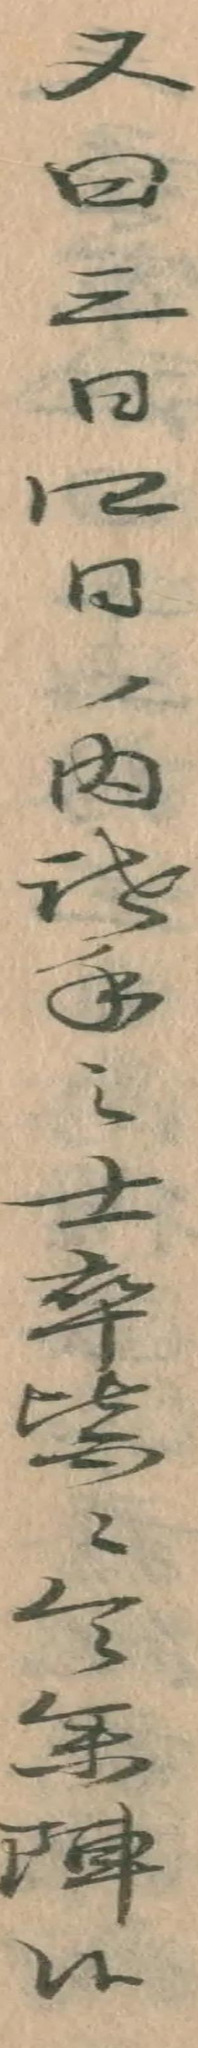又曰三日四日ノ内諸手之士卒皆々令参陣候
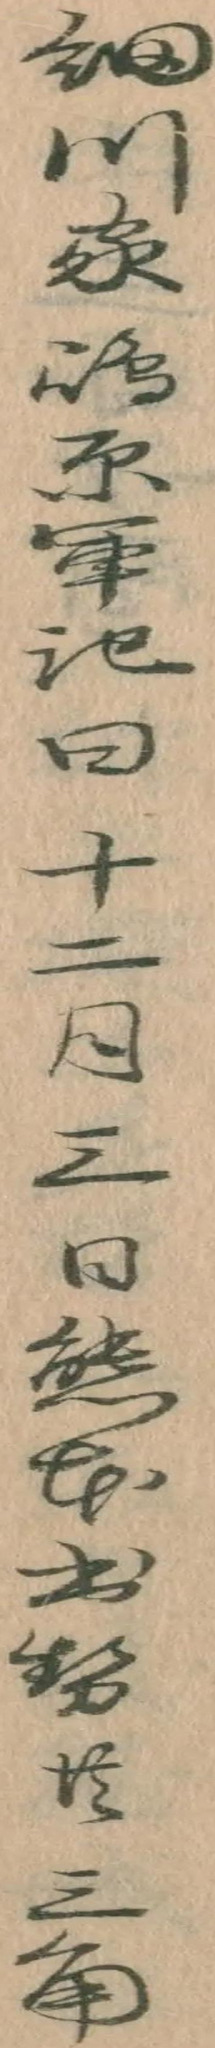細川家島原軍記曰十二月三日熊本出勢共三角
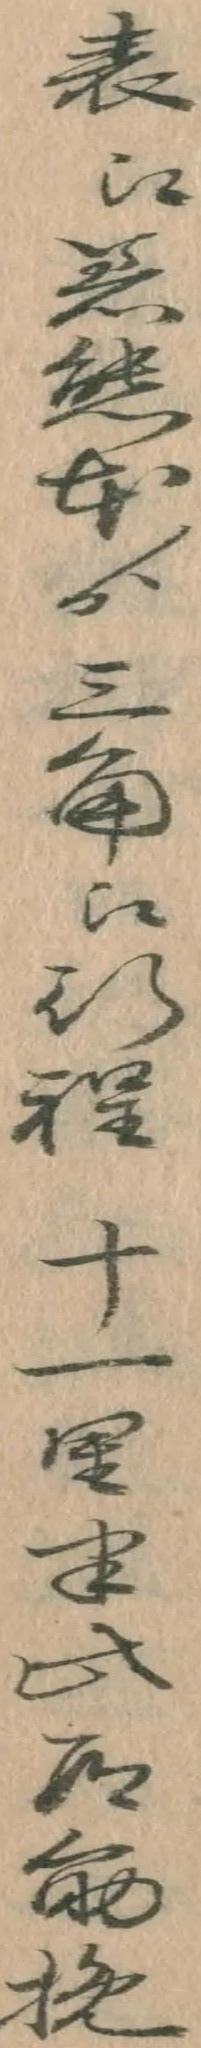表江着熊本ゟ三角江行程十一里半此道筋挽
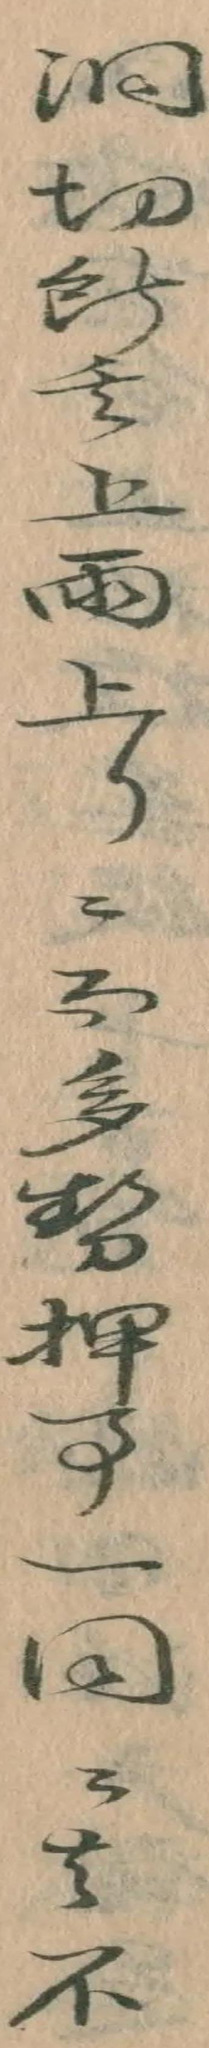洞切所其上両上りに而多勢押事一同には不
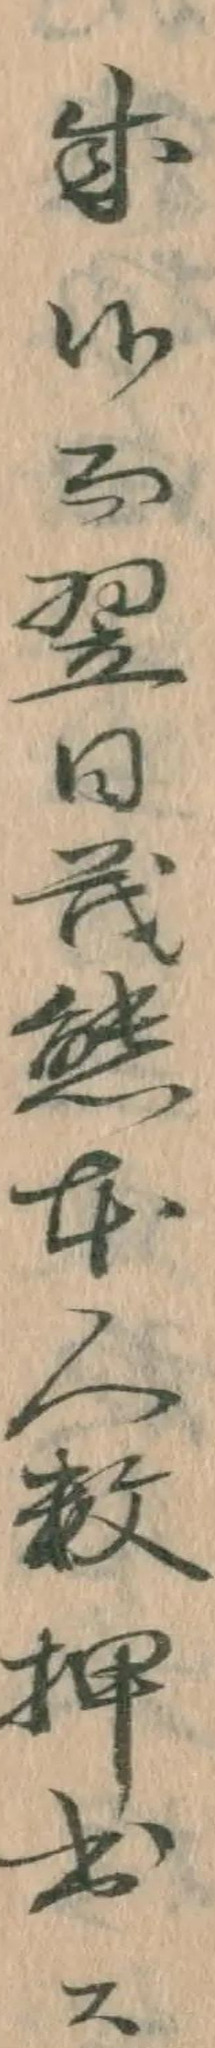成候而翌日も熊本人数押出す
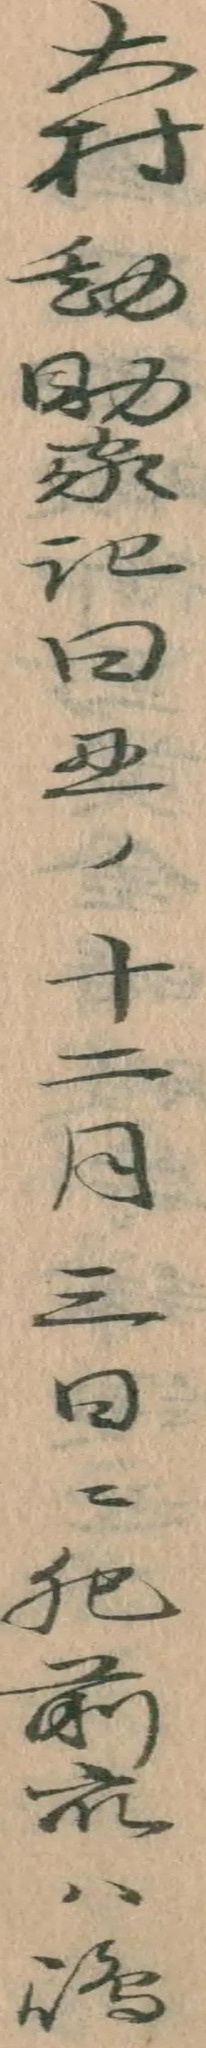大村勘助家記曰丑ノ十二月三日に肥前衆は島
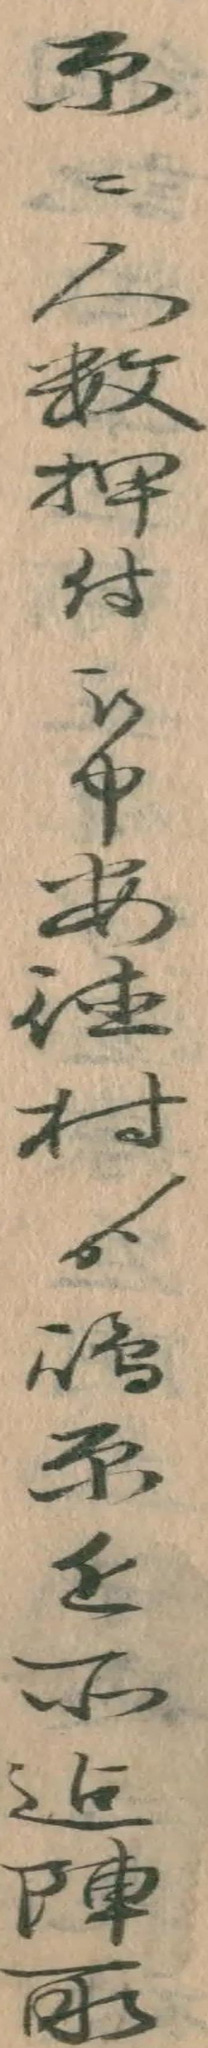原に人数押付被申安徳村ゟ島原近所迄陣取
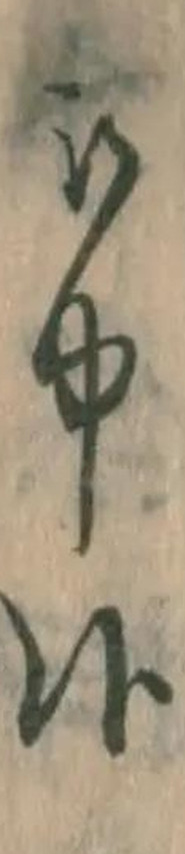被申候
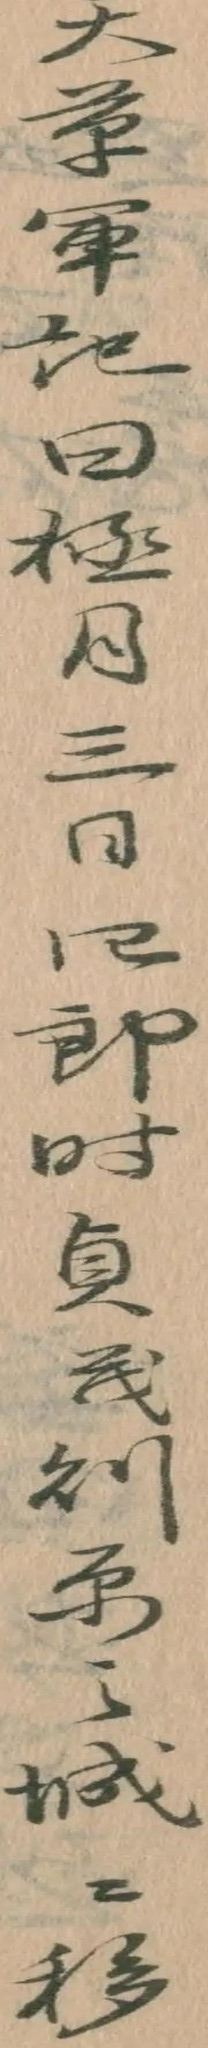天草軍記曰極月三日四郎時貞も則原之城に移
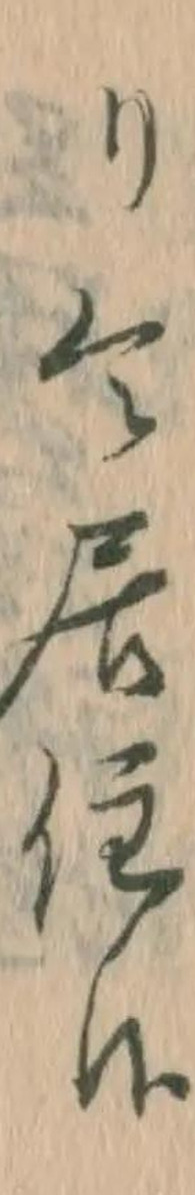り令居住候
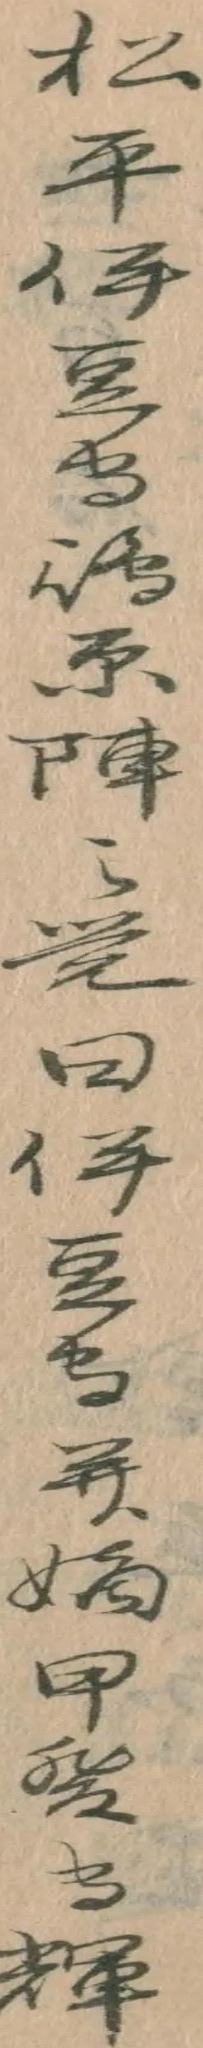松平伊豆守島原陣之覚曰伊豆守并嫡甲斐守輝
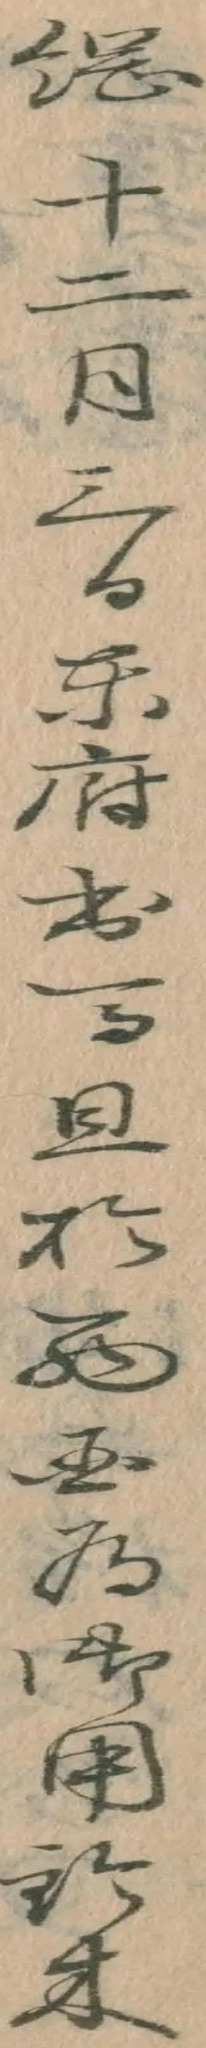綱十二月三日東府出馬且於西国為御用鈴木
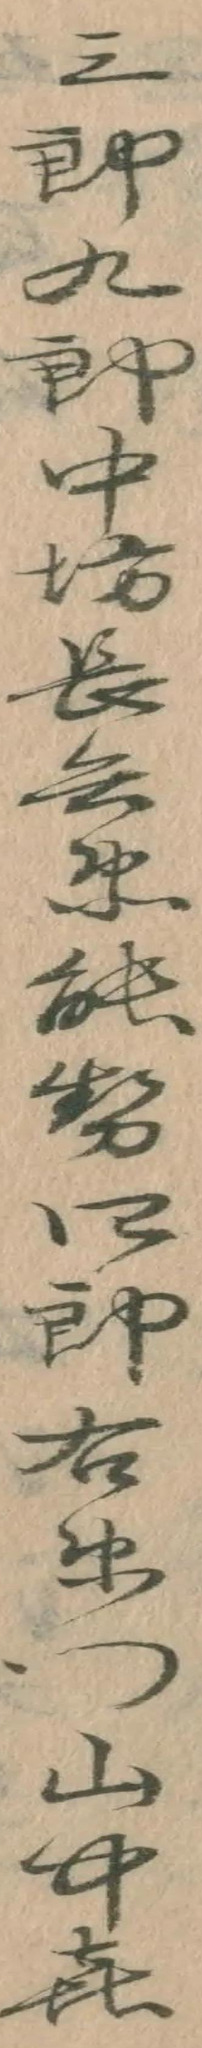三郎九郎中坊長兵衛能勢四郎右衛門山中喜
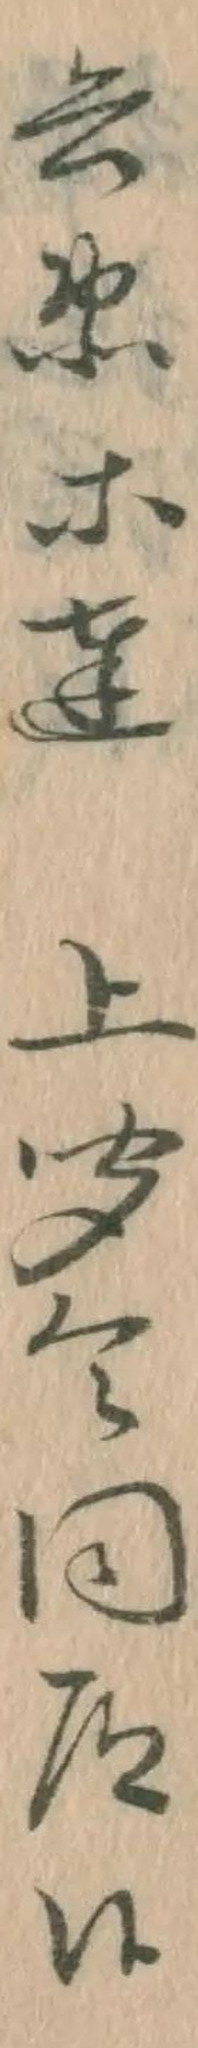兵衛等達上聞令同道候
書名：切支丹御退治記 49巻. [3]
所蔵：国立国会図書館 National Diet Library, JAPAN
